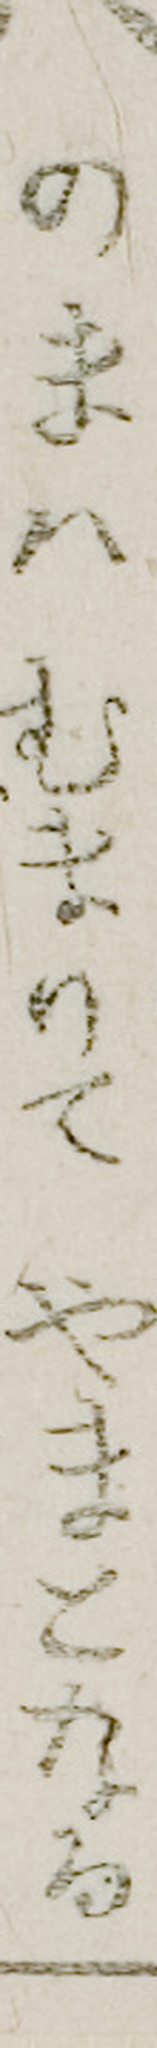八のまハむまりてやまとなる
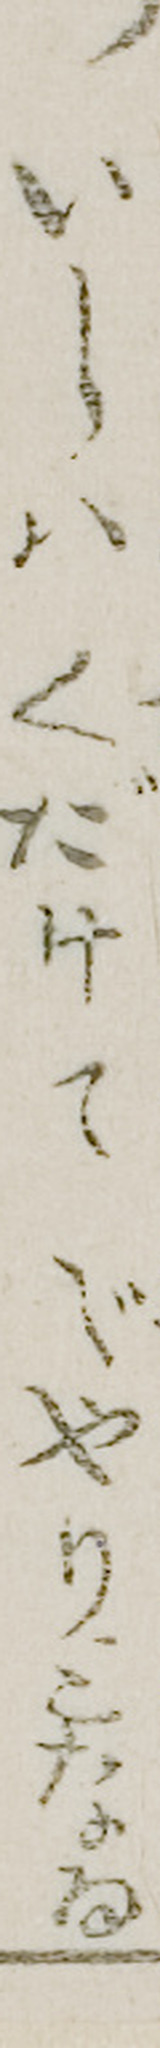いしハくだけてじやりとなる
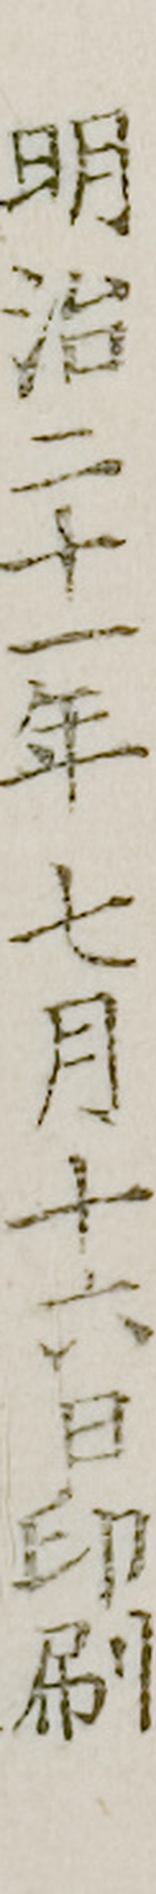明治二十一年七月十六日印刷
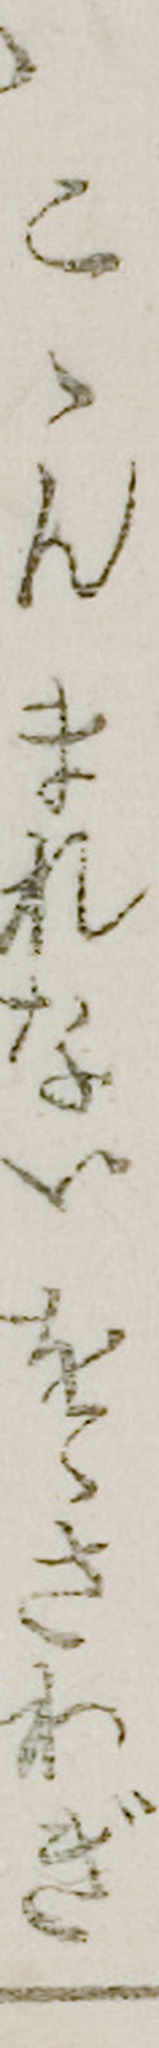こゝんまれないをゝさわぎ
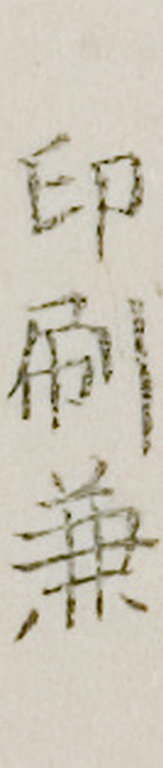印刷兼
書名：会津ばんだいさん大くづれはなし
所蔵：東京大学総合図書館 General Library in the University of Tokyo, JAPAN
